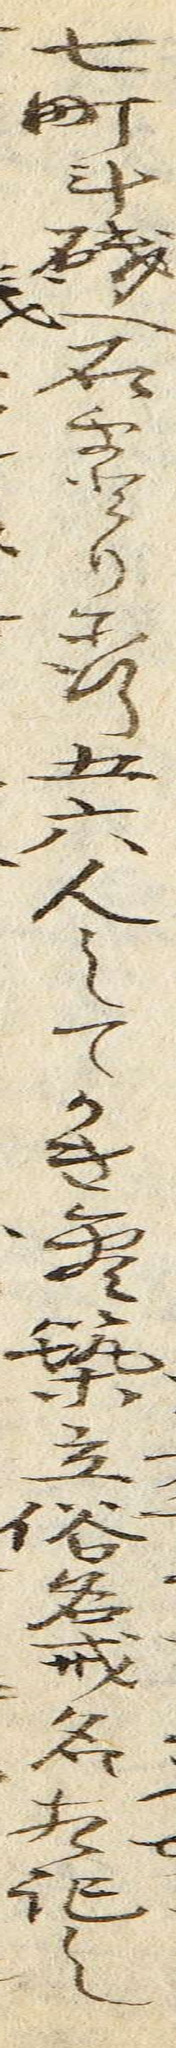七町計磯へ石をとりに行五六人してかき参築立俗名戒名相記し
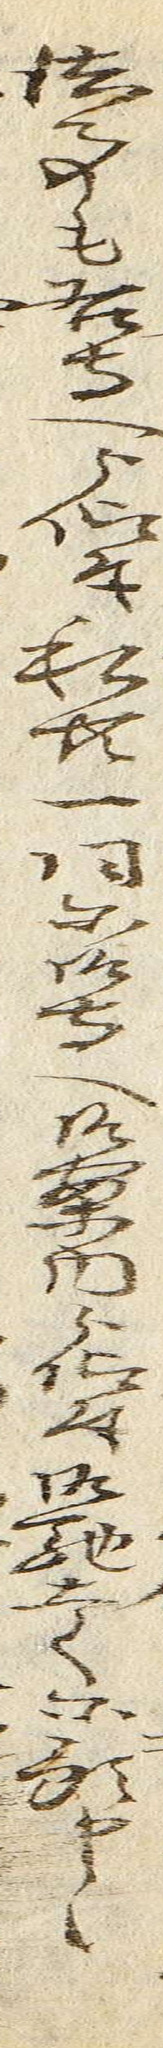法事も右寺へ被仰付私共一同に御寺へ御案内被仰付御馳走に預申候
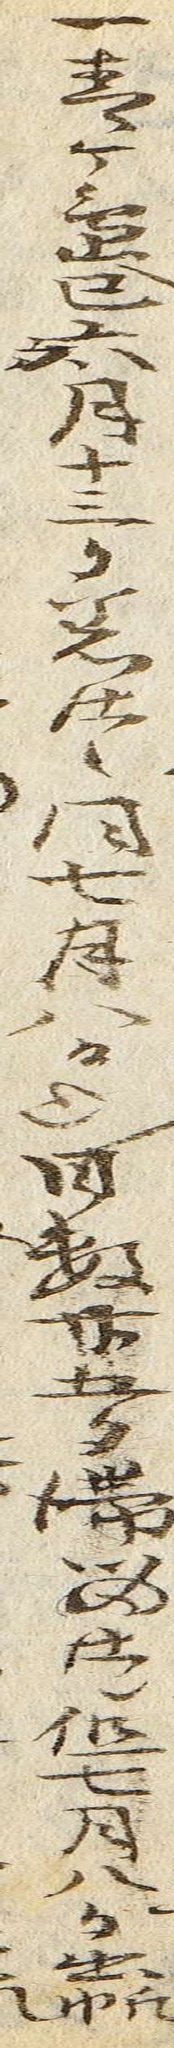一青ケ嶋へ巳六月十三日着仕候同七月八日迄日数廿五日滞留仕候但七月八日出帆
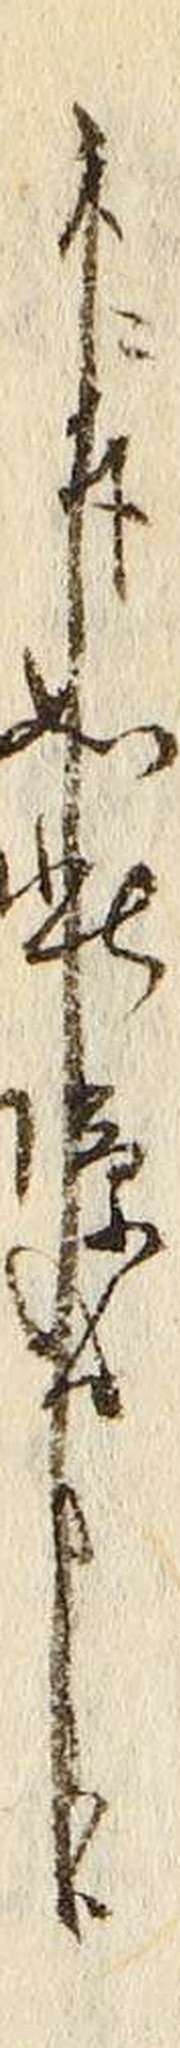候に付如此障候
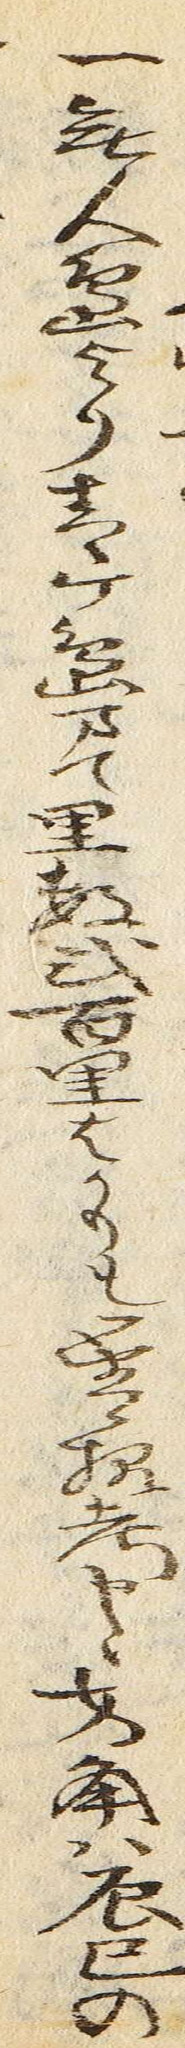一無人島より青ケ島まて里数弐百里はかりも御座候様考申候方角ハ辰巳の
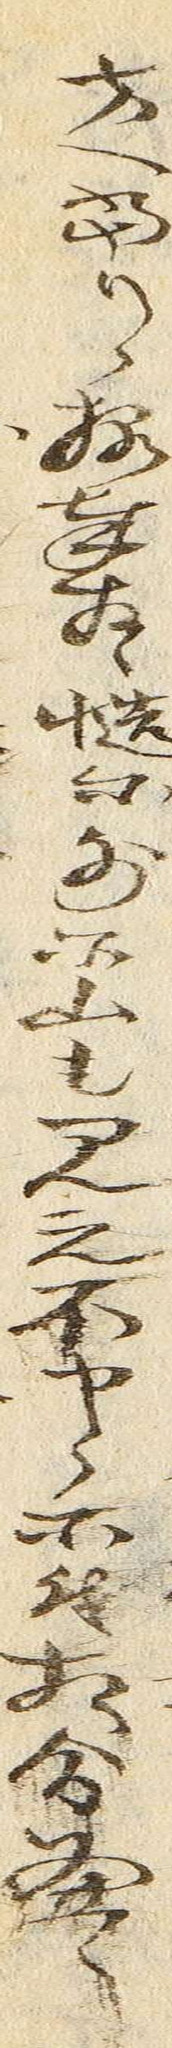方へ当り候様奉存候慥に外に山も見え不申候に付相分兼候
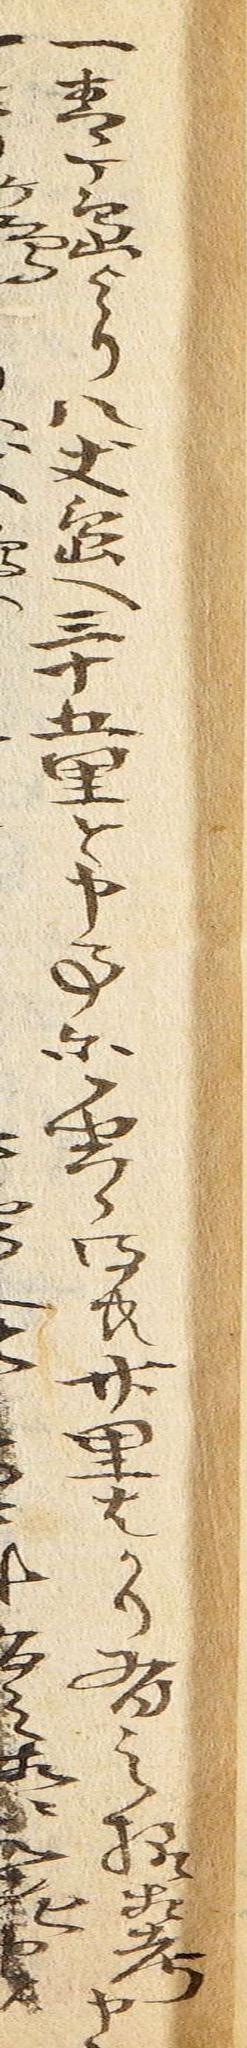一青ケ島より八丈島へ三十五里と申事に御座候得共廿里はかり有之様相考申候
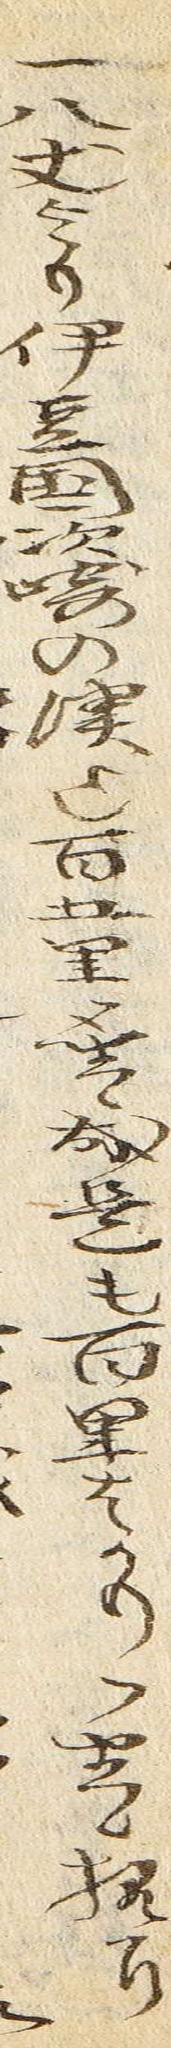一八丈より伊豆国次崎の湊迄百五里御座候哉是も百里はかり御座候様に
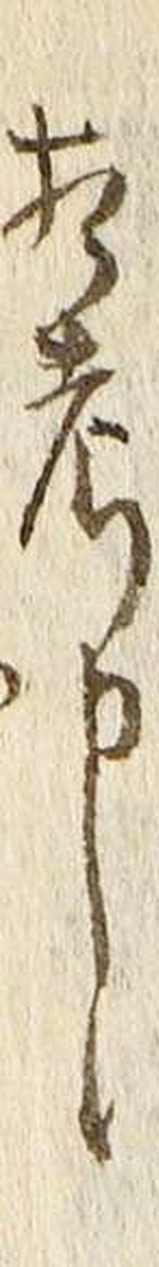相考申候
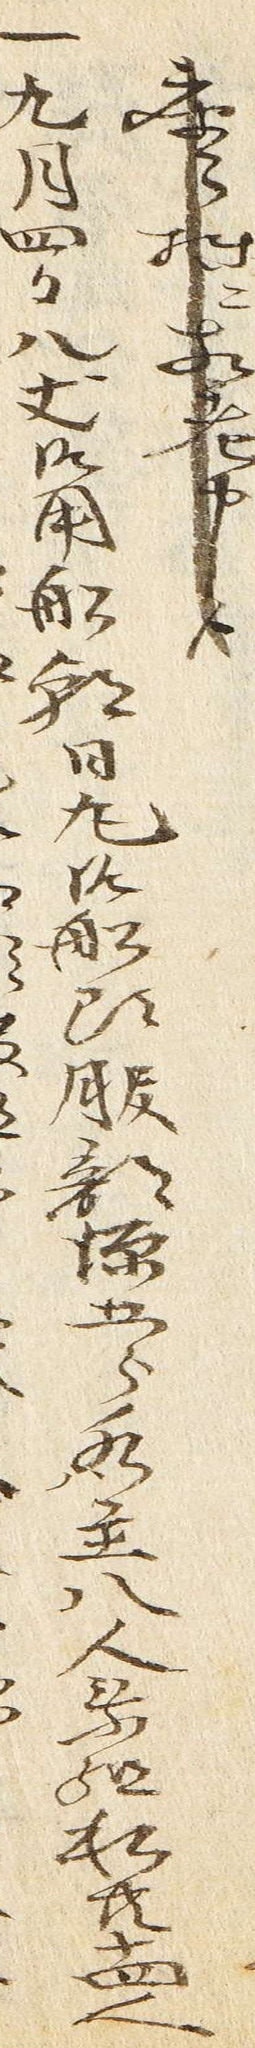一九月四日八丈御用船朝日丸御船頭服部源五郎水主八人乗組私共十四人
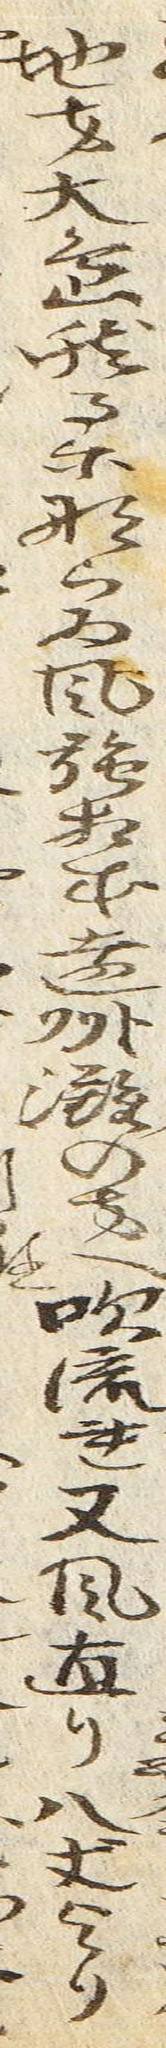地方大島然るにならゐ風強相成遠州灘の方へ吹流れ又風直り八丈より
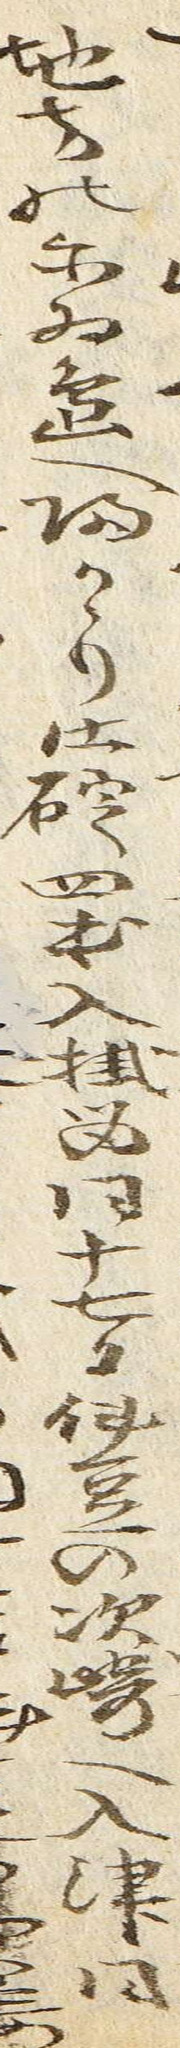地方のにゐ島へ帰かゝり仕碇四本入掛留同十七日伊豆の次崎へ入津同
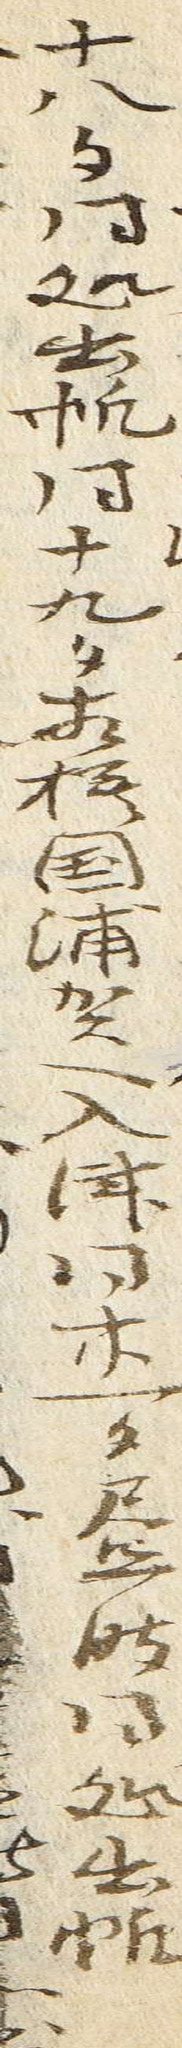十八日同処出帆同十九日相模国浦賀へ入津同廿一日昼時同処出帆
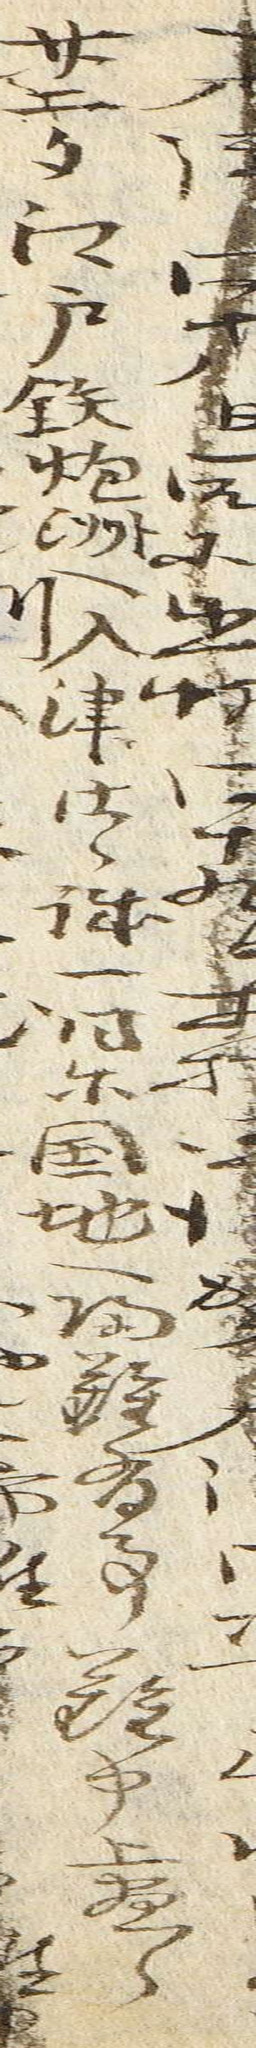廿二日江戸鉄炮洲へ入津仕候誠一同に国地へ帰難有事難申上尽候
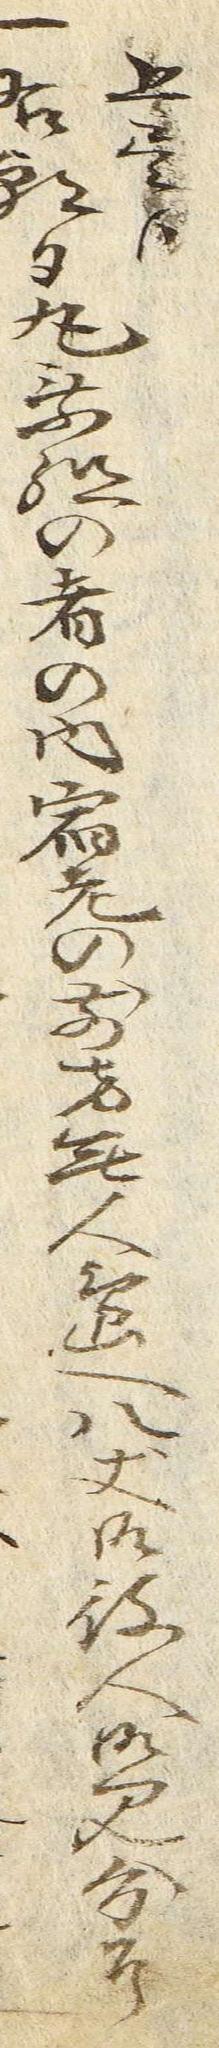一右朝日丸乗組の者の内宿老の前方無人島へ八丈御役人御見分に

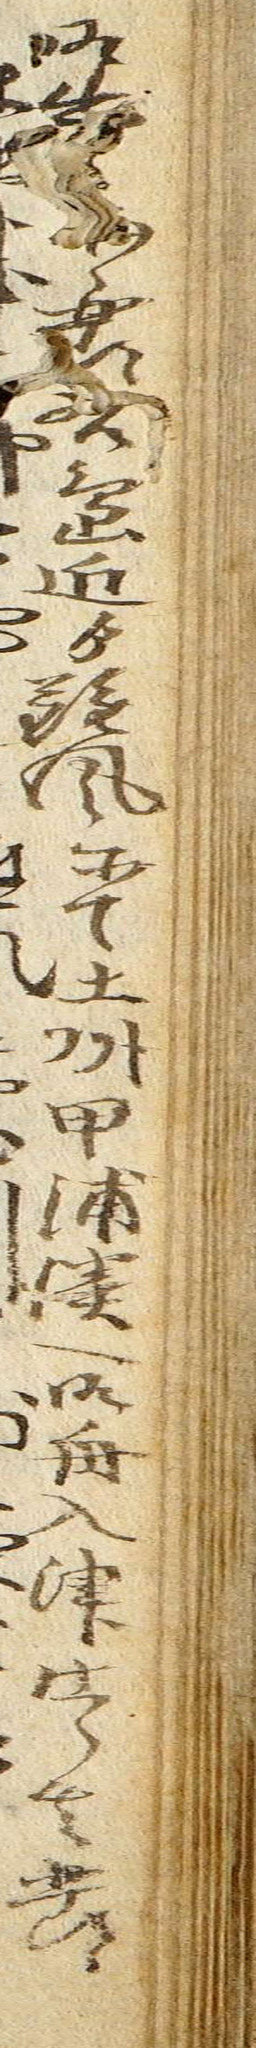御出被成候節右島近ゟ難風にて土州甲浦湊へ御舟入津仕候其節
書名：無人島漂流書付
